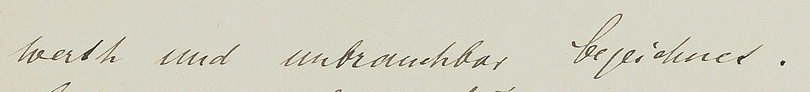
-werth und unbrauchbar bezeichnet.
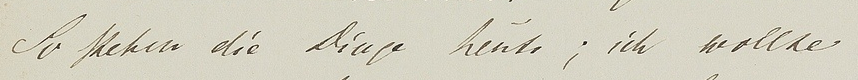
So stehen die Dinge heute; ich wollte
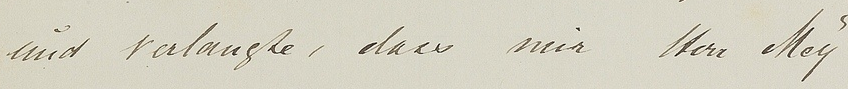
und verlangte, dass mir Herr Mey
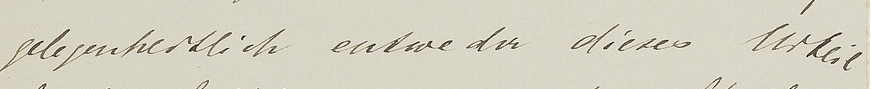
gelegenheitlich entweder dieses Urteil
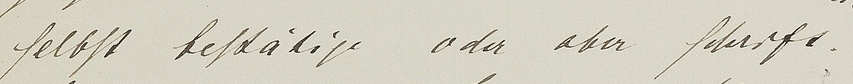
selbst bestätige oder aber schrift-
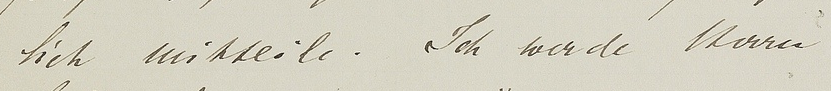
lich mitteile. Ich werde Herrn
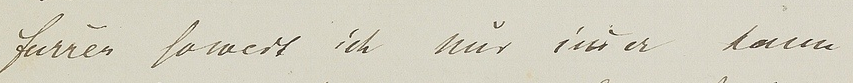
Furrer soweit ich nur immer kann
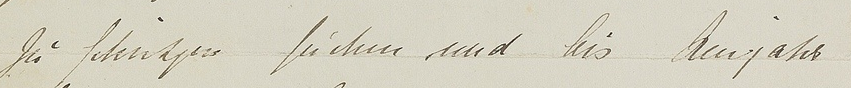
zu schützen suchen und bis Neujahr
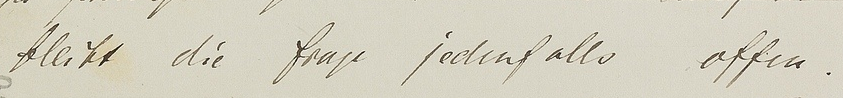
bleibt die Frage jedenfalls offen.
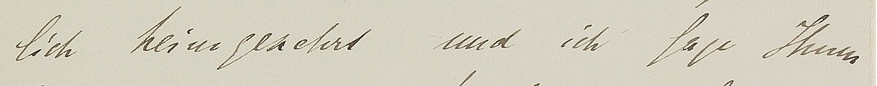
lich heimgekehrt und ich sage Ihnen
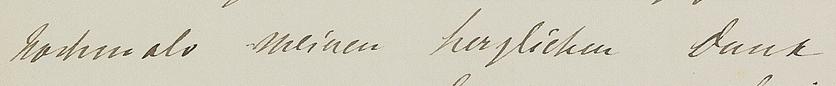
nochmals meinen herzlichen Dank
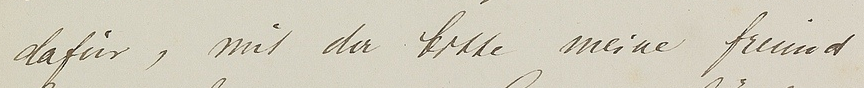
dafür, mit der Bitte meine freund-
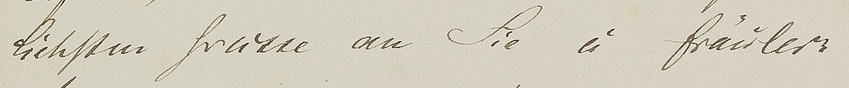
lichsten Grüsse an Sie u Fräulein
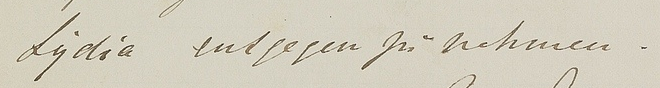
Lydia entgegenzunehmen.
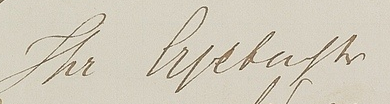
Ihr Ergebenster
